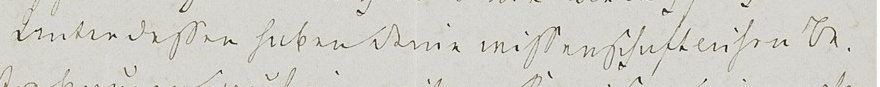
Unterdessen haben deine wissenschaftlichen Be-
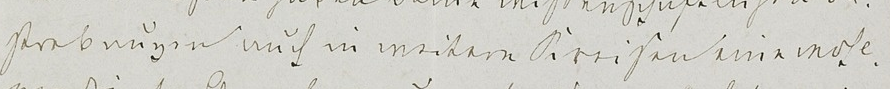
strebungen auch in weitern Kreisen eine wohl-
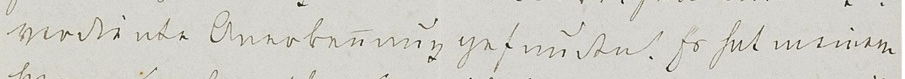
verdiente Anerkennung gefunden. Es hat meinem
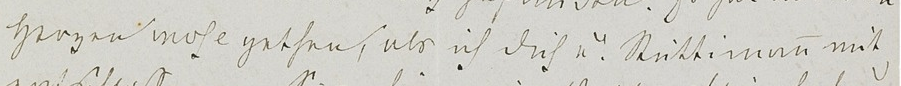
Herzen wohl gethan, als ich dich u. Rüttimann mit
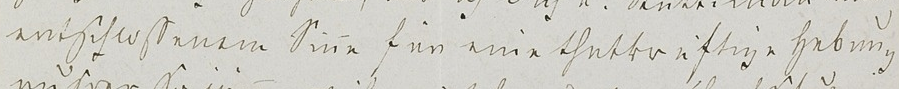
entschlossenem Sinne für eine thatkräftige Hebung
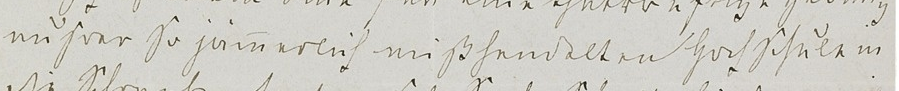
unsrer so jämmerlich mißhandelten Hochschule in
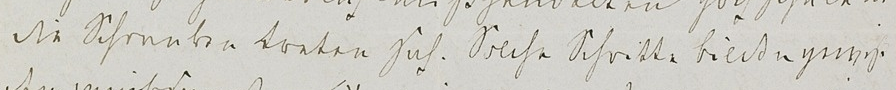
die Schranken treten sah. Solche Schritte bilden gewiß
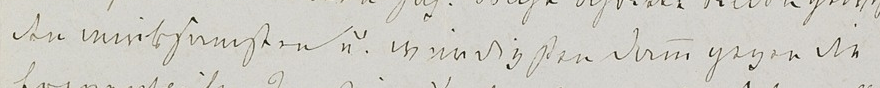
den wirksamsten u. würdigsten Damm gegen die
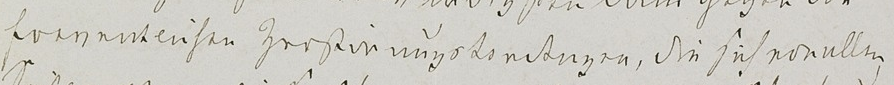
freventlichen Zerstörungstendenzen, die sich von allen
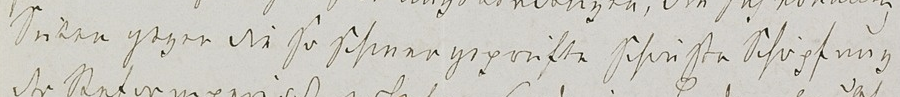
Seiten gegen die so schwer geprüfte schönste Schöpfung
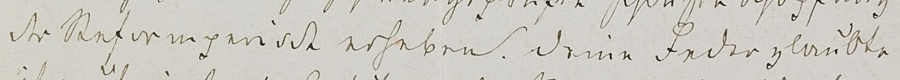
der Reformperiode erheben. Deine Feder glaubte
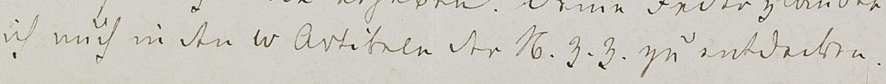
ich auch in den ω Artikeln der N.Z.Z. zu entdecken.
